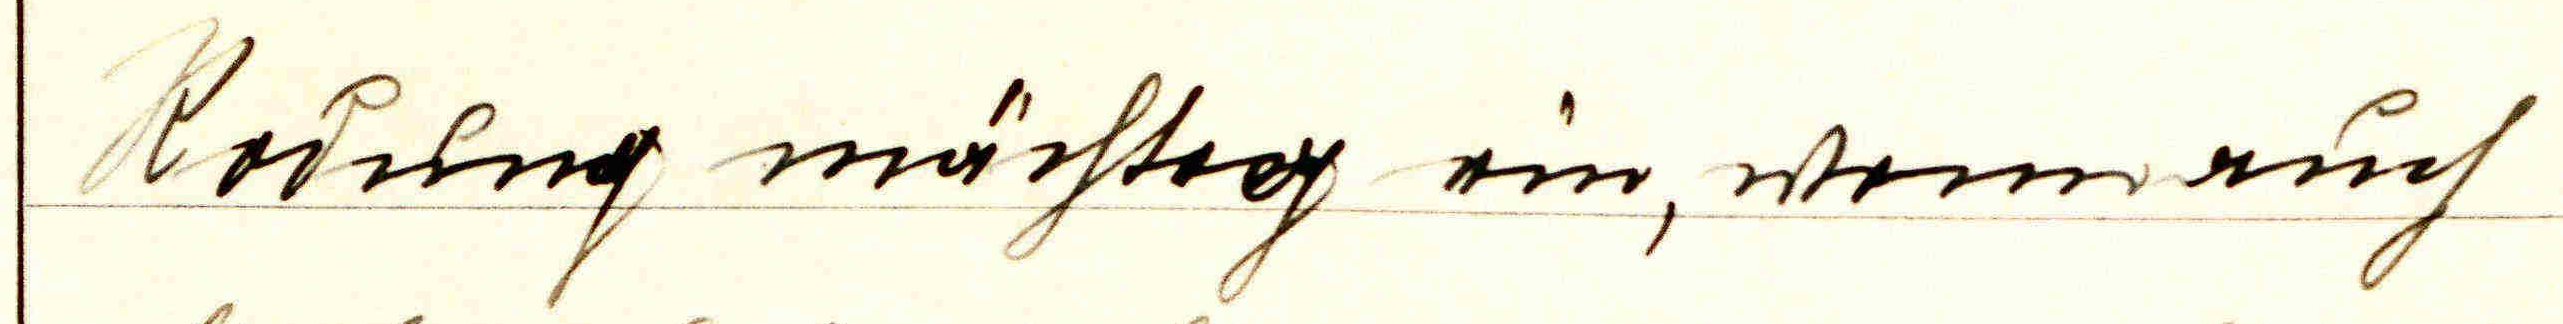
Rodung mächtig ein, wenn auch
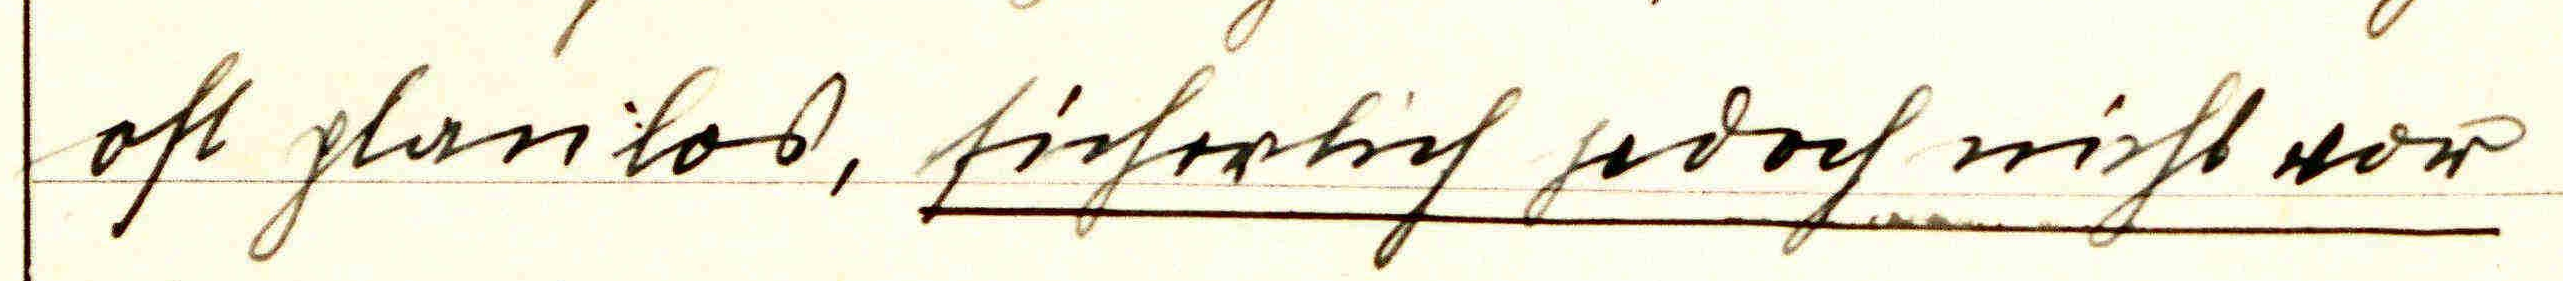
oft planlos, sicherlich jedoch nicht vor
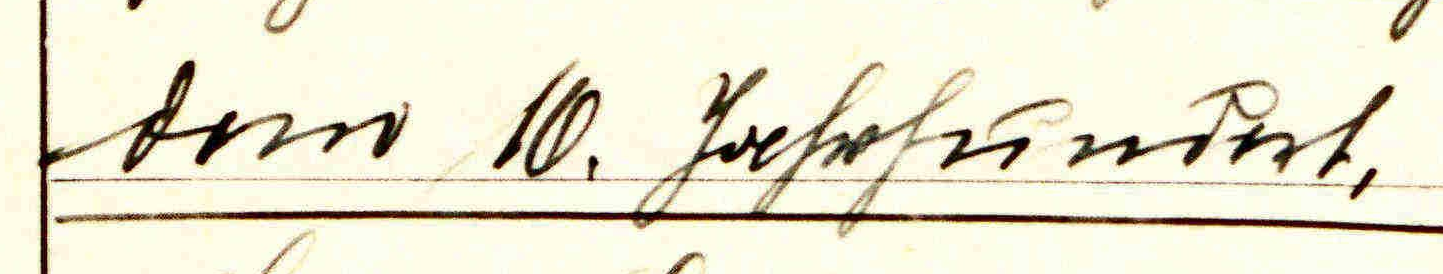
dem 10. Jahrhundert.
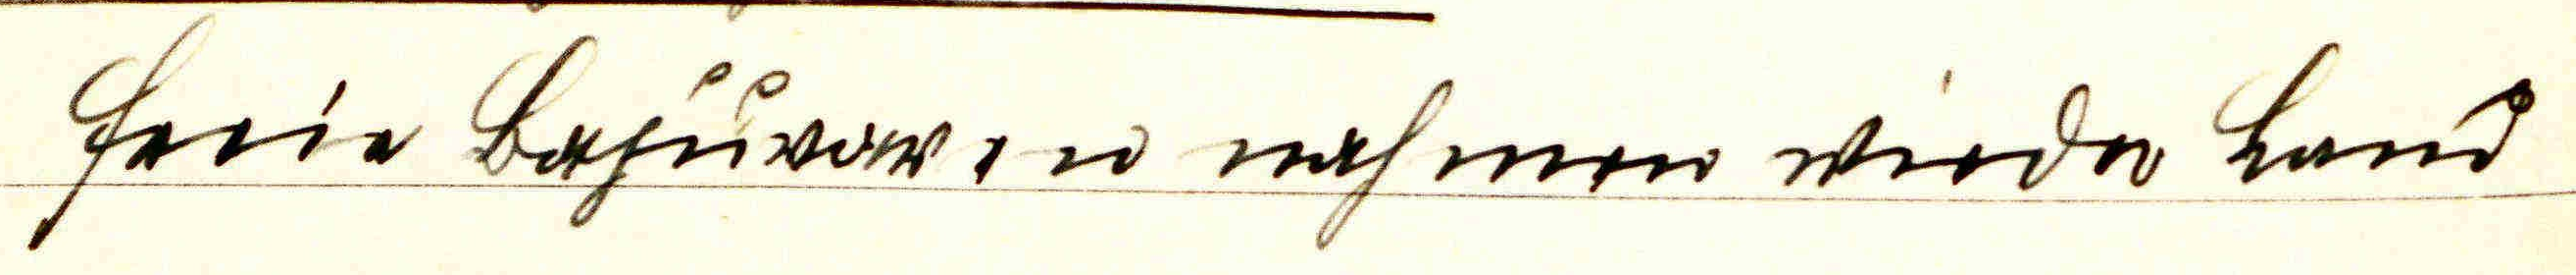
Freie Bajuwaren nahmen wieder Land
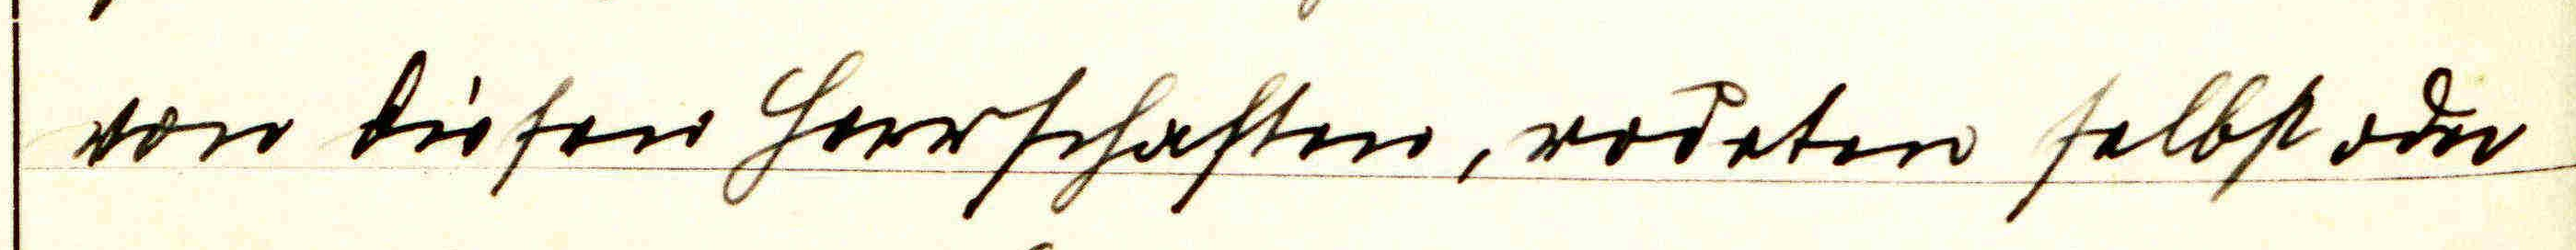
von diesen Herrschaften, rodeten selbst oder
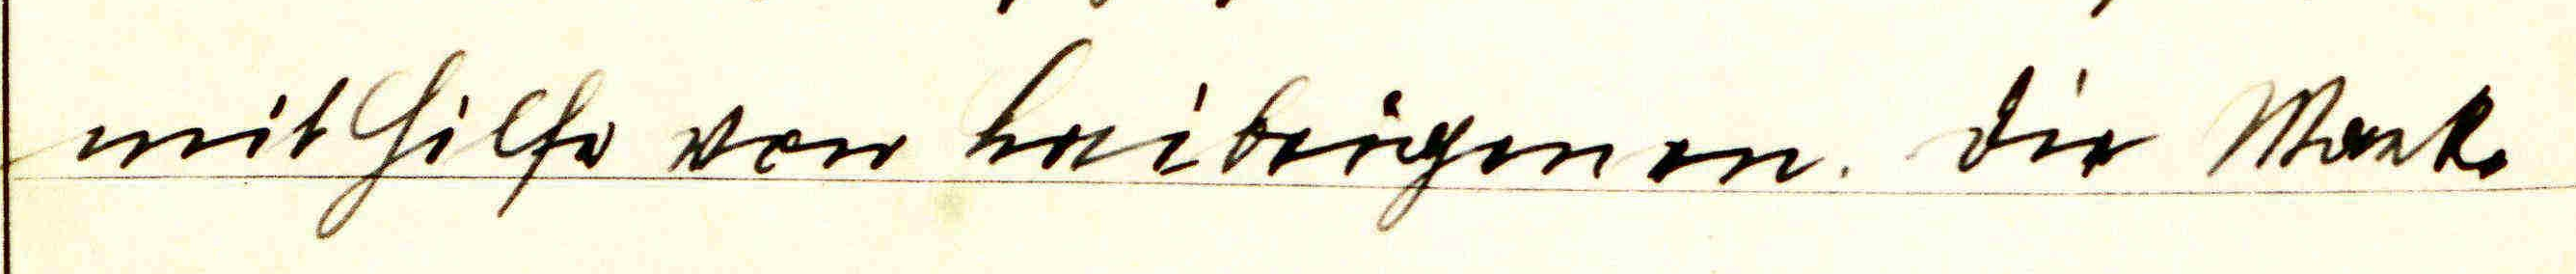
mit Hilfe von laibeigenen. Die Mark-
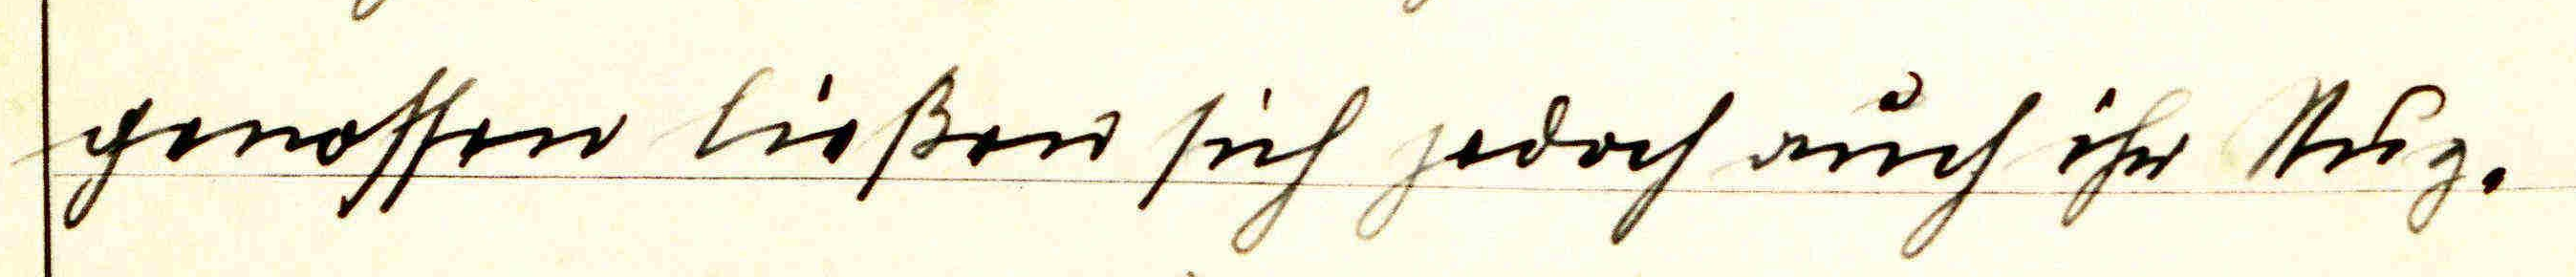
genossen ließen sich jedoch auch ihr Aus-
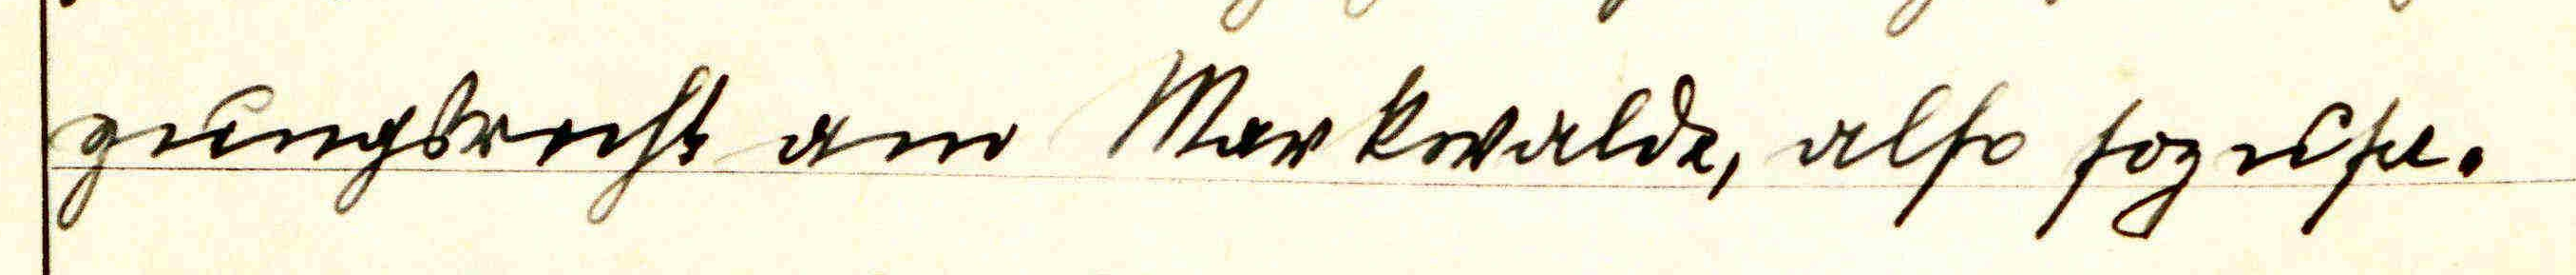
zungsrecht am Markwalde, also sozusa-
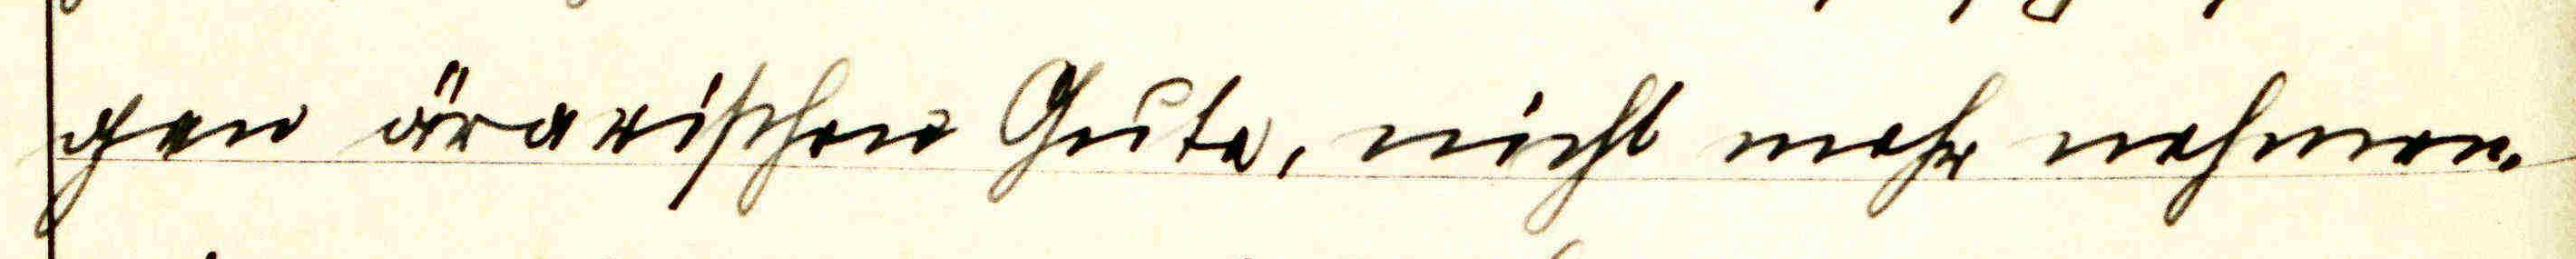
gen ärarischen Gute, nicht mehr nehmen
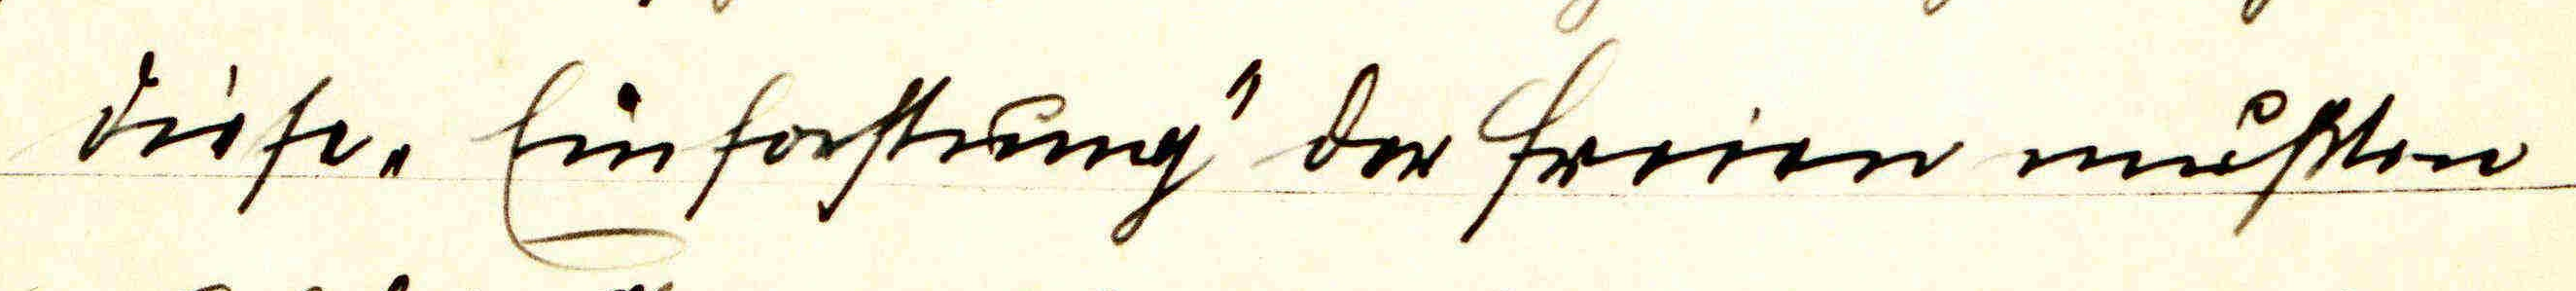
diese "Einforstung" der Freien mußten
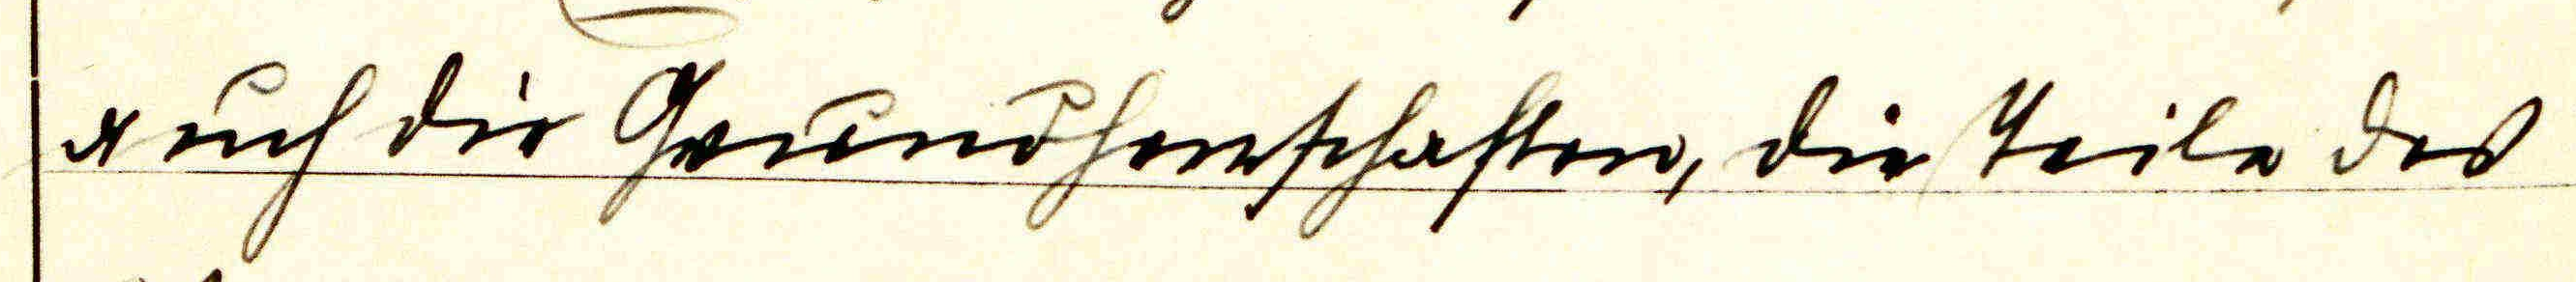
auch die Grundherrschaften, die Teile des
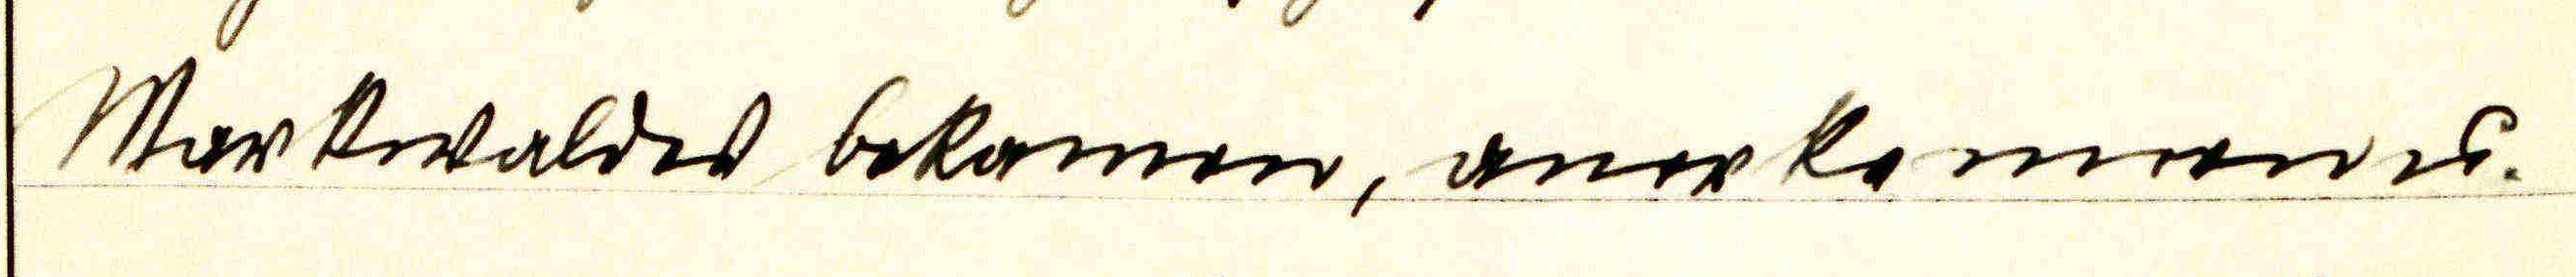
Markwaldes bekamen, anerkennens
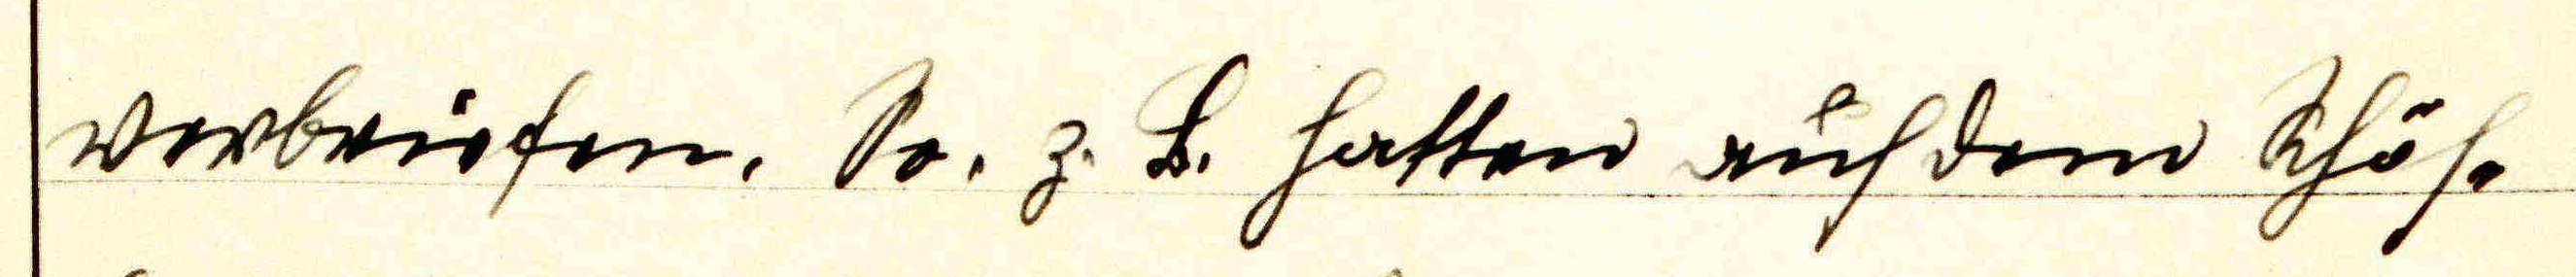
verbriefen, So. z.B. hatten aud dem Schöf-
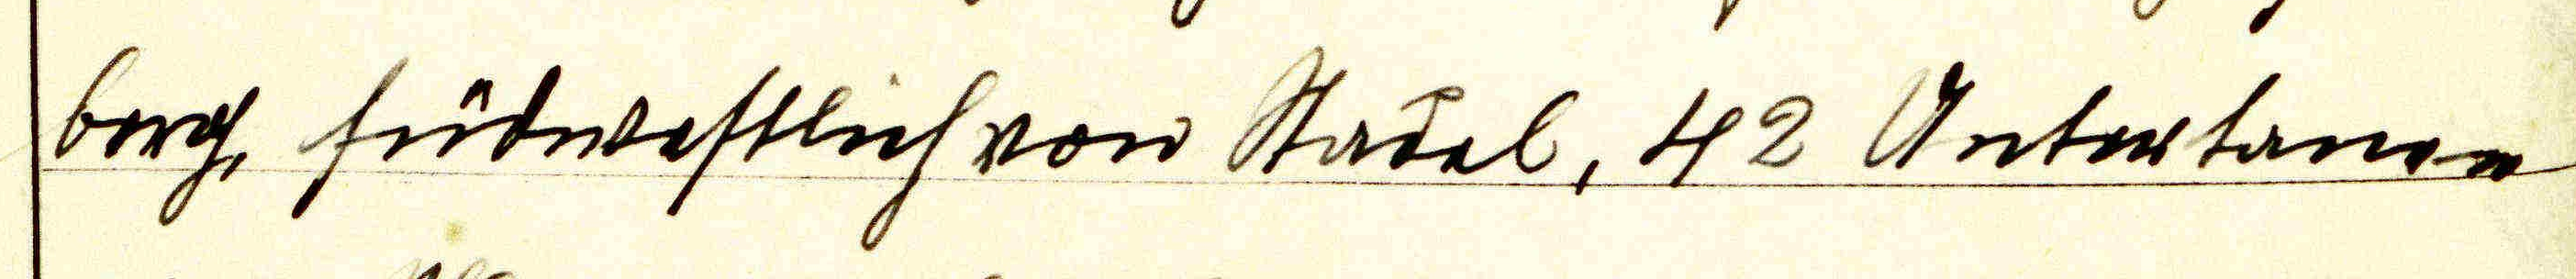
berg südwestlich von Stadel, 42 Untertanen
